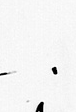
z.
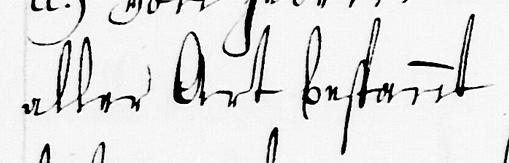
aller Art bespannt
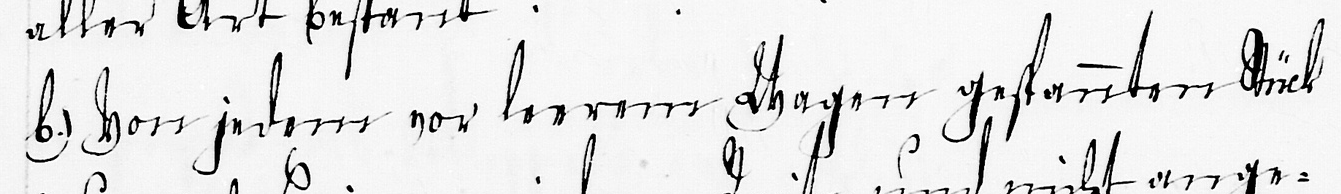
b.) Von jedem vor leerem Wagen gespannten Stück
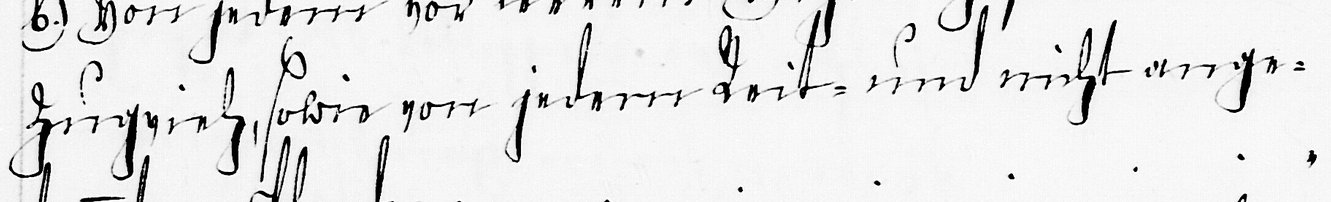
Zugvieh, sowie von jedem Reit- und nicht ange¬
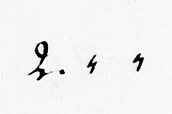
2. “
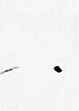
“
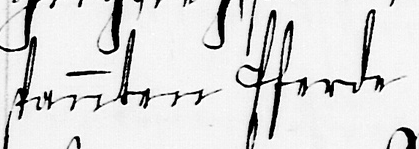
pannten Pferde.
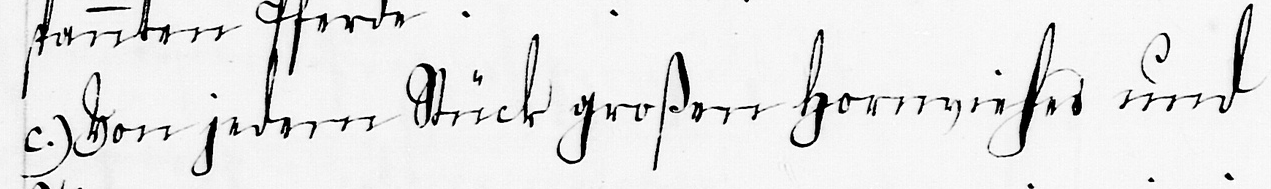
c.) Von jedem Stück großen Hornviehes und
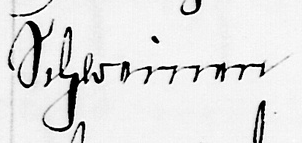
Schweinen
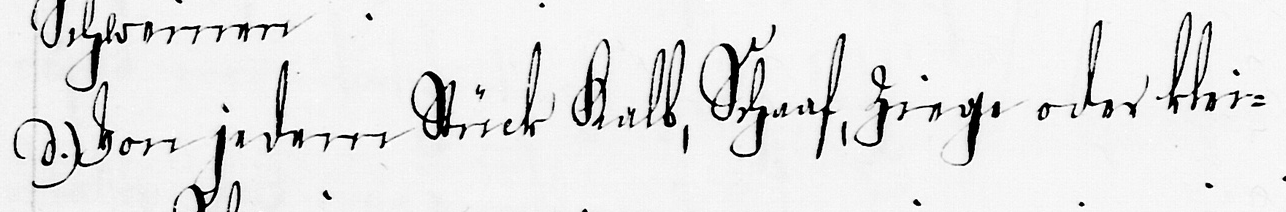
d.) Von jedem Stück Kalb, Schaaf, Ziege oder klei¬
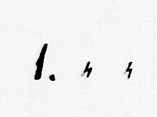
1. “ “
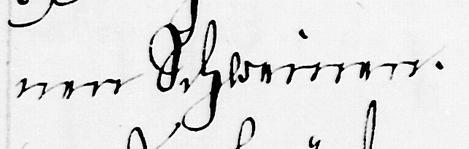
nen Schweinen
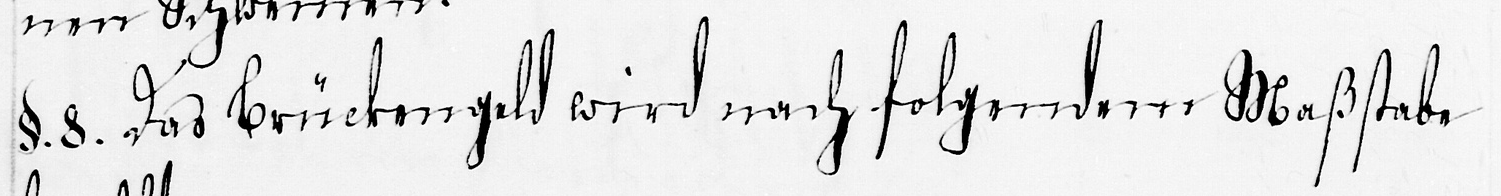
§. 8. Das Brückenged wird nach folgendem Maßstabe
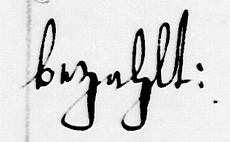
bezahlt:
